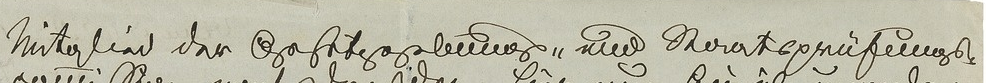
Mitglied der Gesetzgebungs- und Staatsprüfungs-
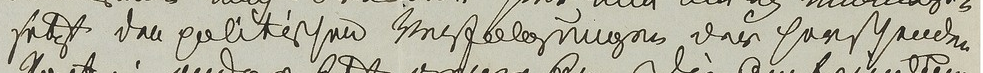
setzt den politischen Verfolgungen der herschenden
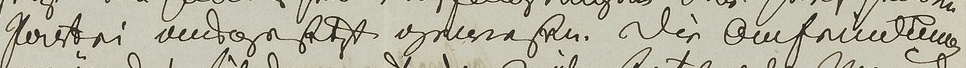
Partei ausgesetzt gewesen. Die Anfeindung
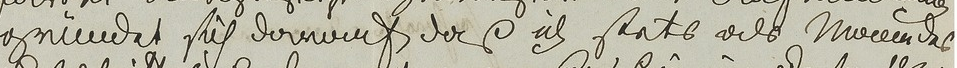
gründet sich darauf, daß ich stets als Mann des
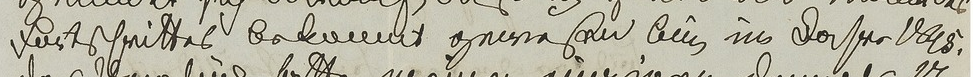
Fortschrittes bekannt gewesen bin, im Jahre 1845.
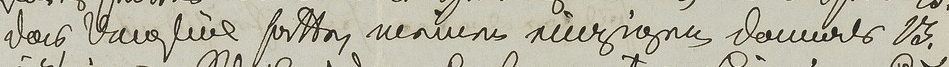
das Unglück hatte, meinen einzigen damals 23.
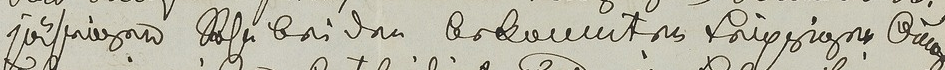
jährigen Sohn bei den bekannten Leipziger Aug-
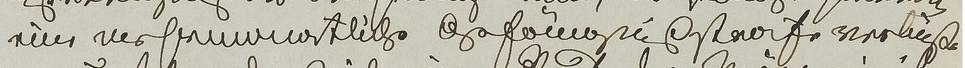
eine mehrmonatliche Gefängnisßtrafe verbüß-
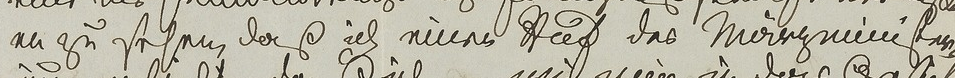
en zu sehen, daß ich einen Ruf des Märzminister-
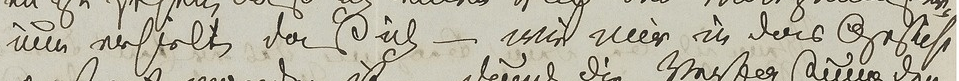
ium erhielt, daß ich – wie mir in das Gesicht
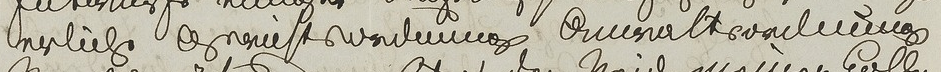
erliche Gerichtsordnung, Anwaltsordnung
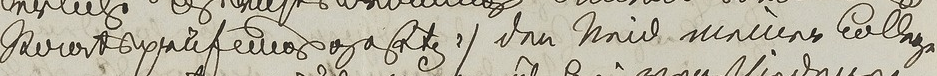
Staatsprüfungsgesetz) den Neid meiner Colleg-
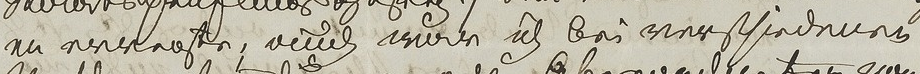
en erregte; auch war ich bei verschiedenen
